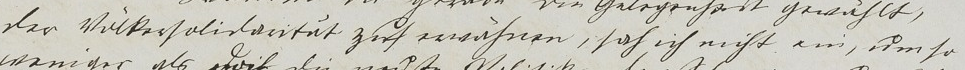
der Völkersolidarität zus erwähnen, sah ich nicht ein, um so
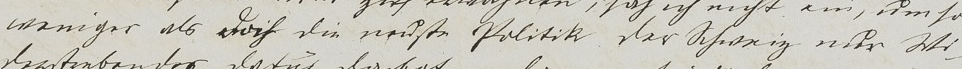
weniger als doch die neuste Politik der Schweiz nur Wi-
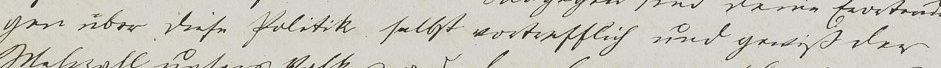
gen über diese Politik selbst vortrefflich und gewiß der
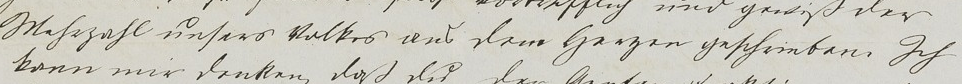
Mehrzahl unsers Volkes aus dem Herzen geschrieben. Ich
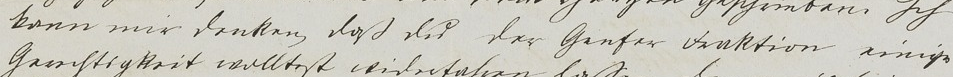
kann mir denken, daß du der Genfer Fraktion einige
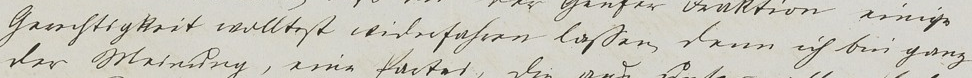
Gerechtigkeit wolltest widerfahren lassen, denn ich bin ganz
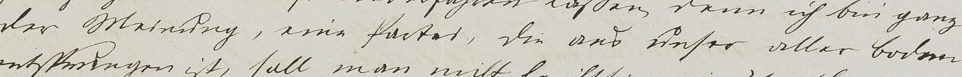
der Meinung, eine Partei, die aus unser aller Boden
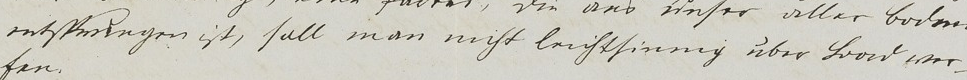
entsprungen ist, soll man nicht leichtsinnig über Bord wer-
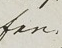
fen.
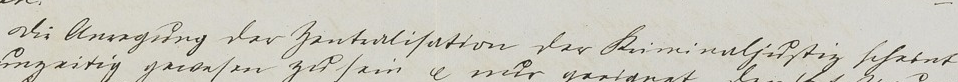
Die Anregung der Zentralisation der Kriminaljustiz scheint
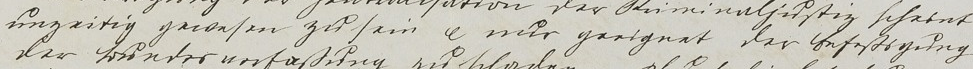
unzeitig gewesen zu sein & nur geeignet der Befestigung
